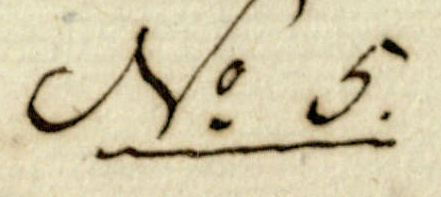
Nº 5.
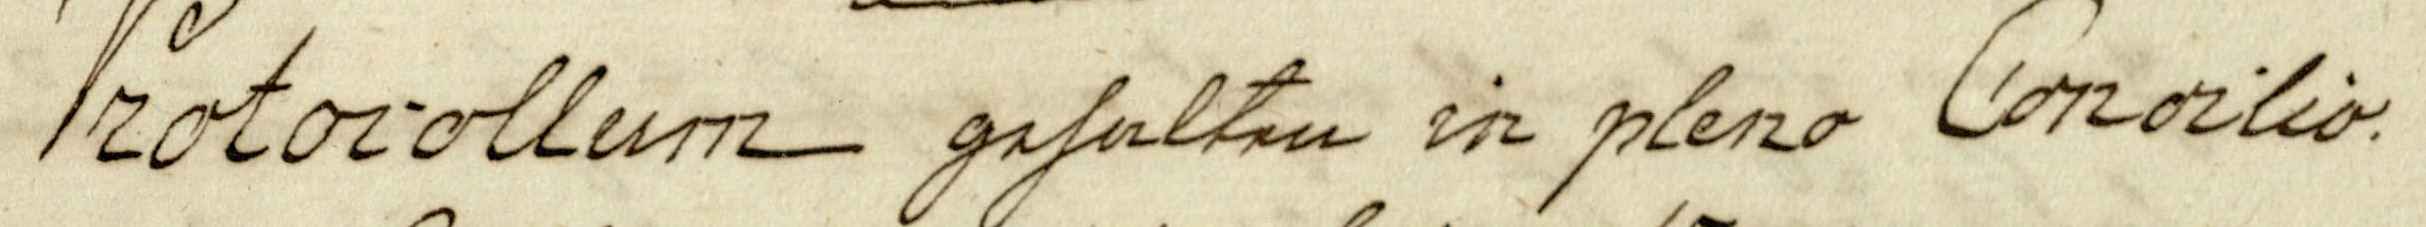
Protocollum gehalten in pleno Concilio.
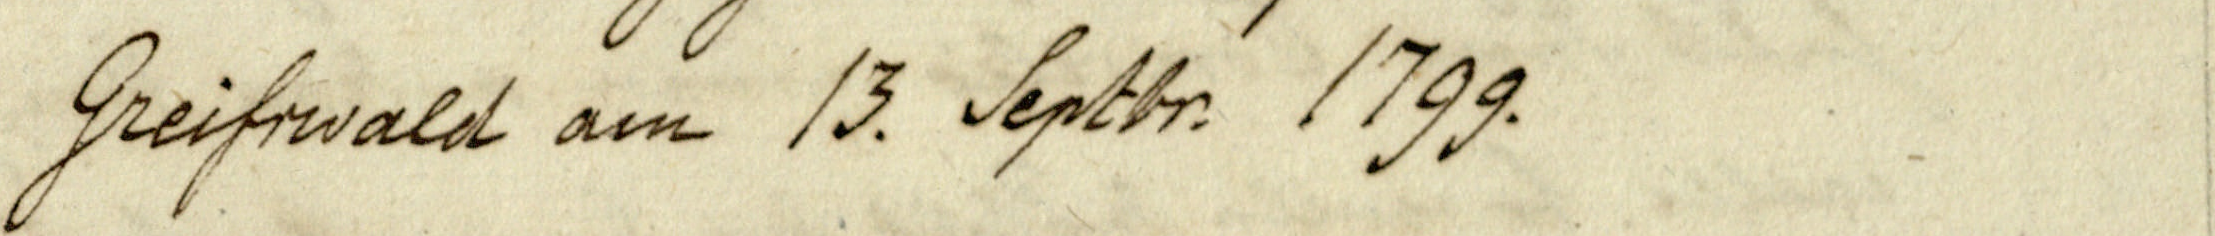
Greifswald am 13. Septbr. 1799
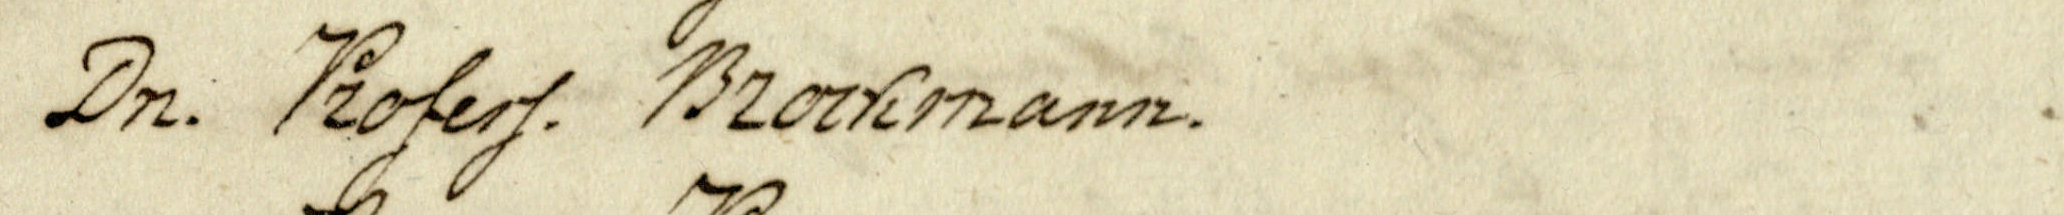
Dn. Profess. Brockmann.
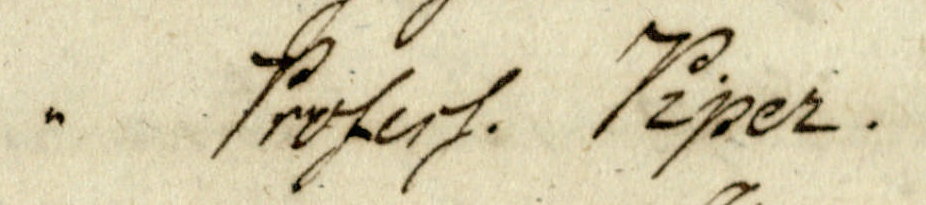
Profess. Piper.
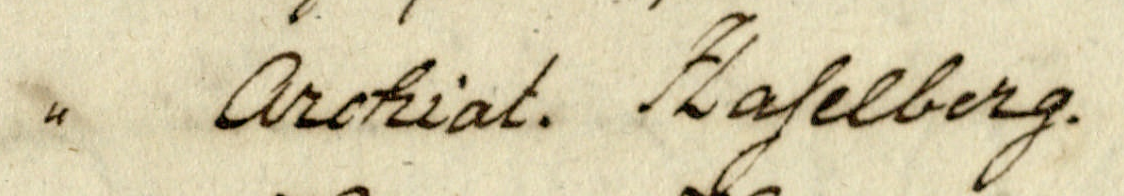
Archiat. Haselberg.
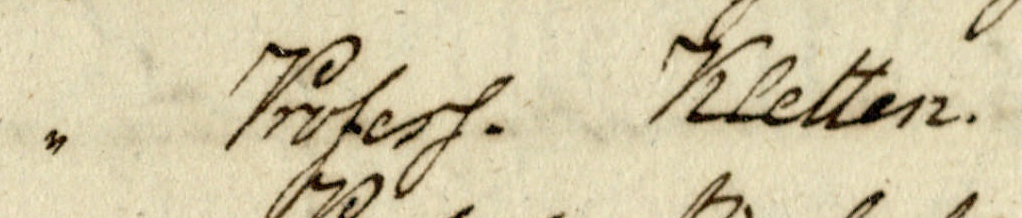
Profess. Kletten.
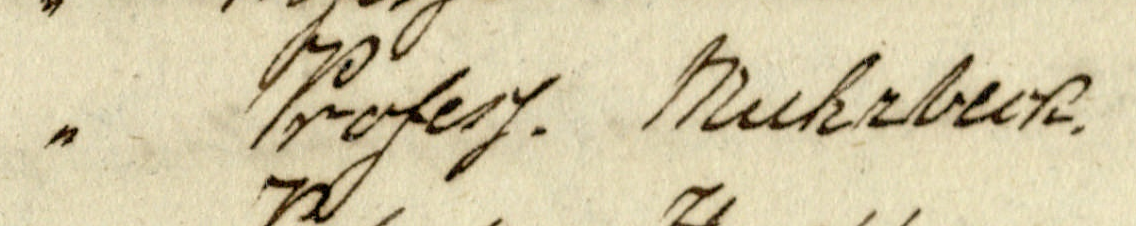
Profess. Muhrbeck.
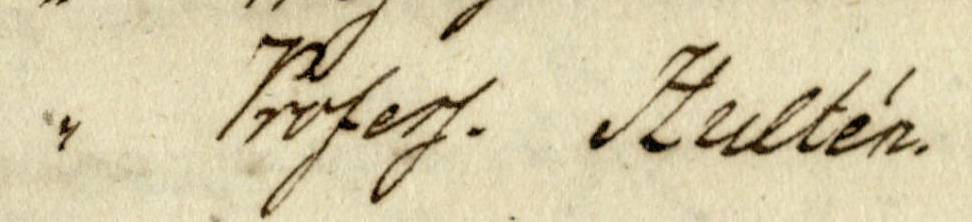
Profess. Hultèn.
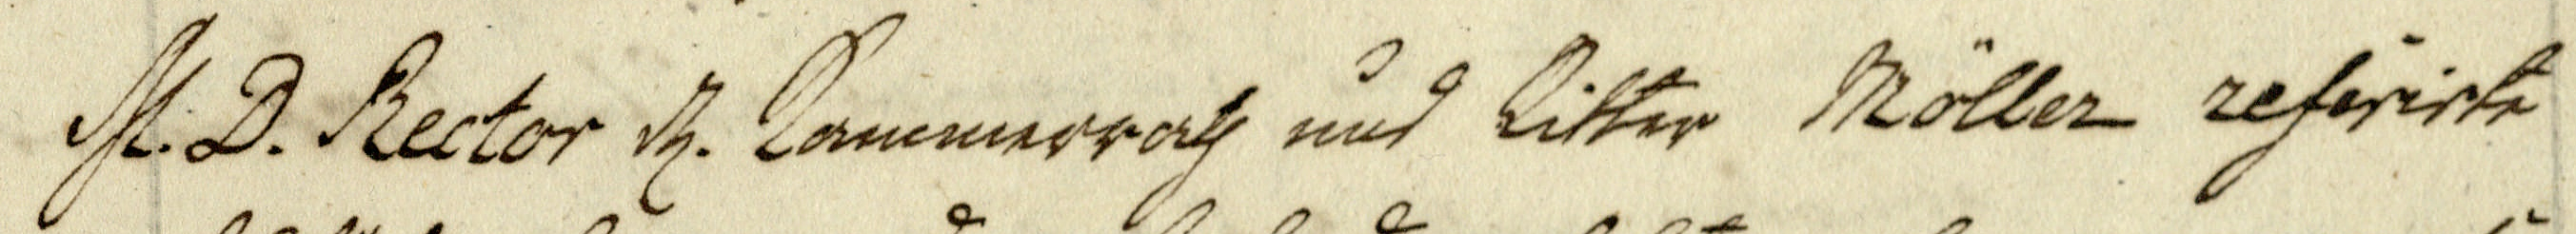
M. D. Rector dh. Kammerrath und Ritter Möller referirte
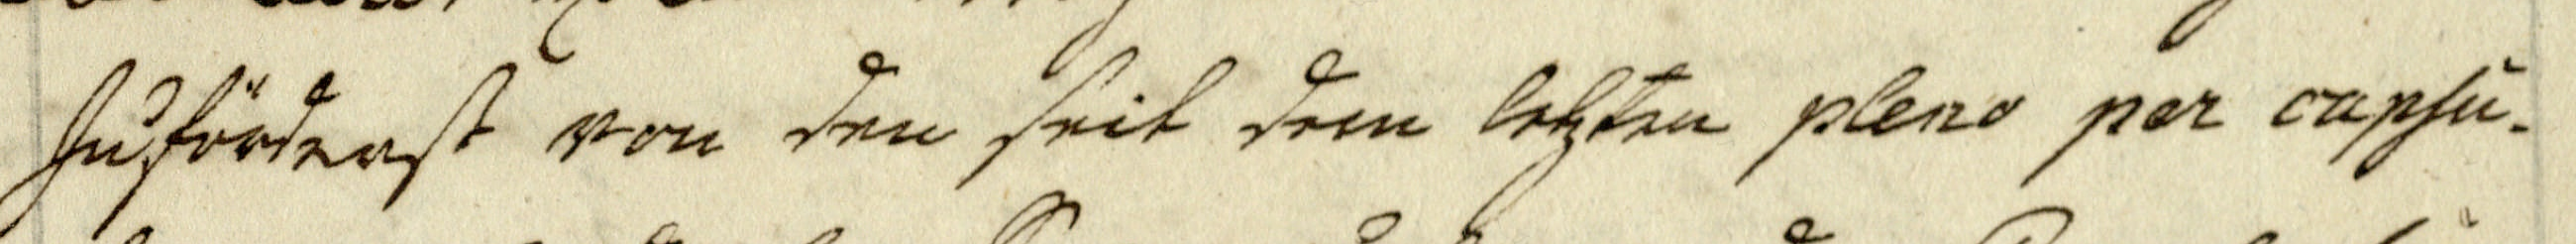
zuförderst von den seit dem letzten pleno per capsu¬
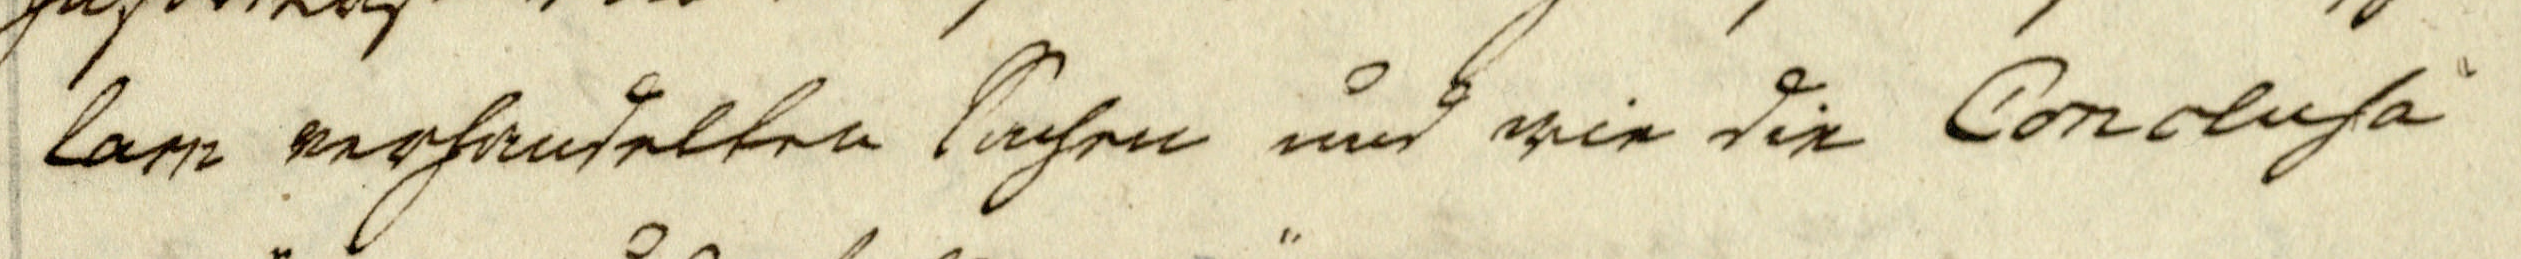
lam verhandelten Sachen und wie die Conclusa
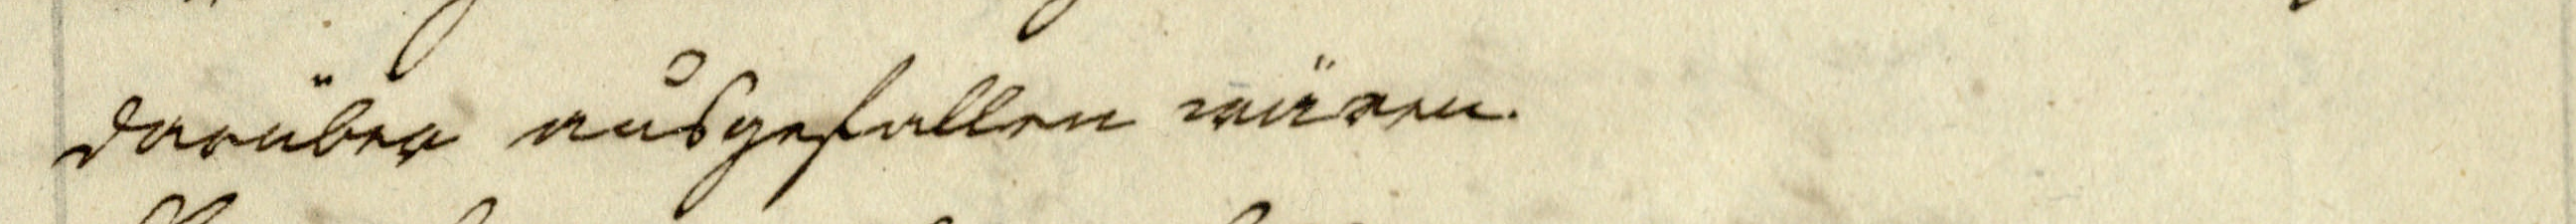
darüber ausgefallen wären.
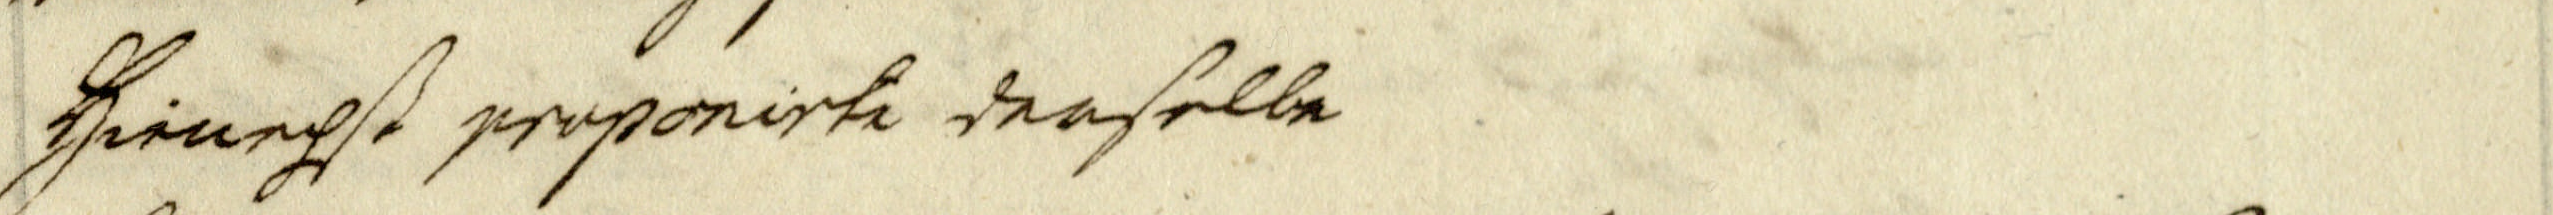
Hienechst proponirte derselbe
